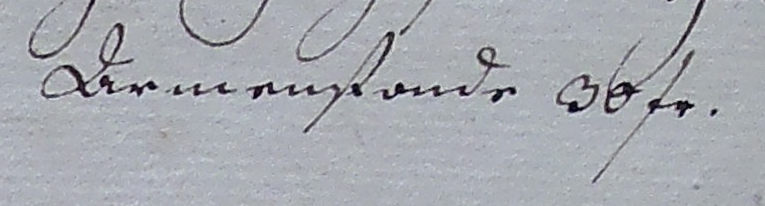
Armenfonde 30fr.
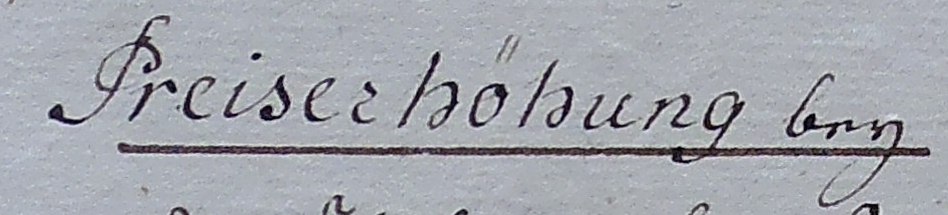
Preiserhöhung bey
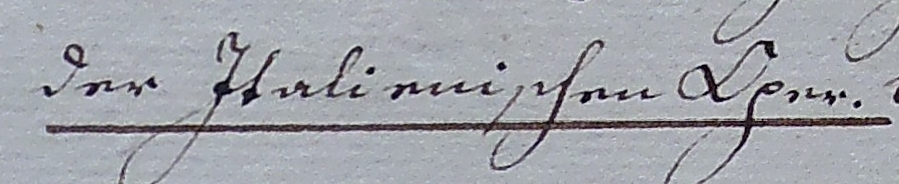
der Italienischen Oper.
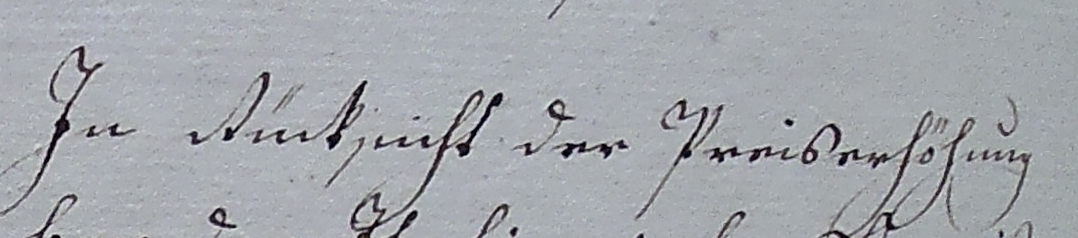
In Rücksicht der Preiserhöhung
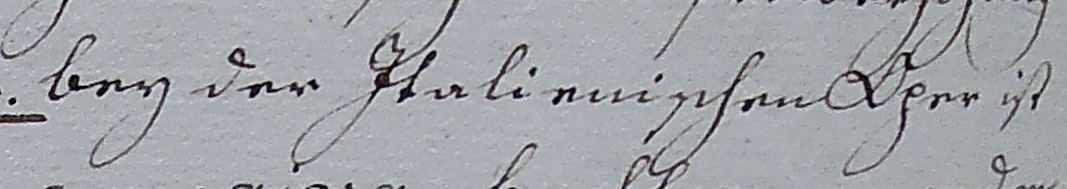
bey der Italienischen Oper ist
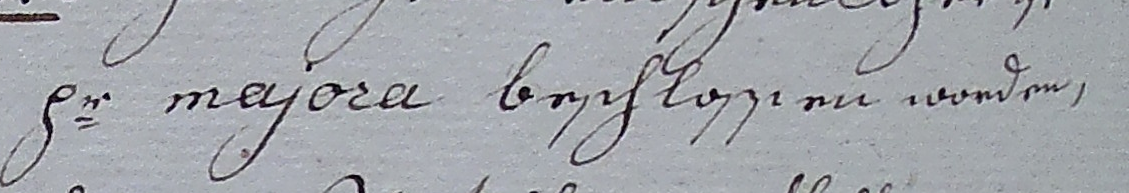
pr͇ majora beschlossen worden,
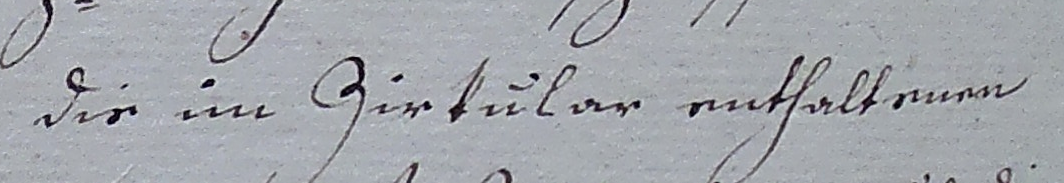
die im Zirkular enthaltenen
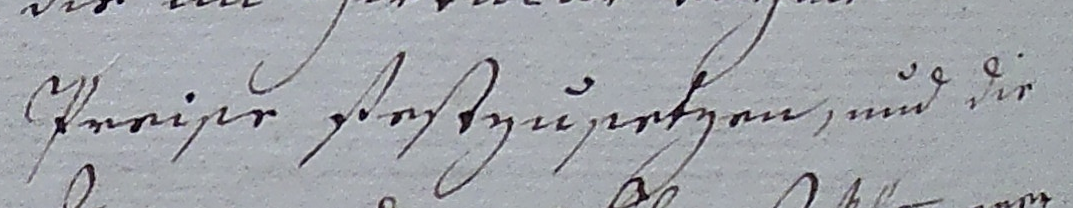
Preise festzusetzen, und die
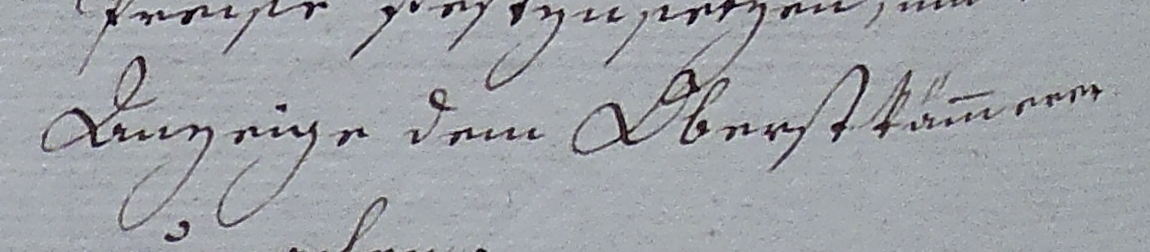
Anzeige dem Oberstkäm̅erer
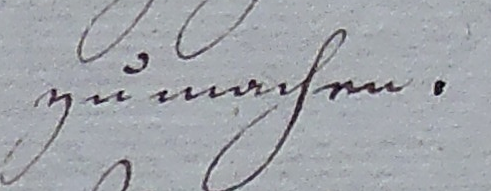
zu machen.
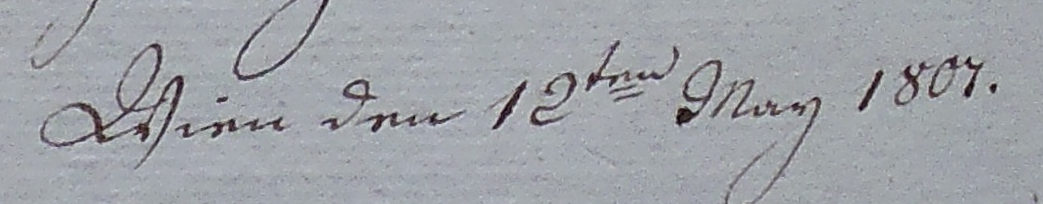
Wien den 12te͇n May 1807.
